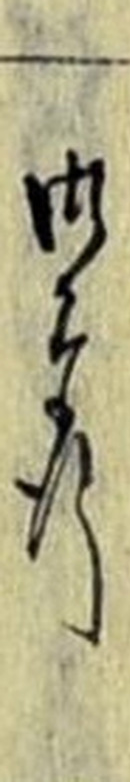御奉行
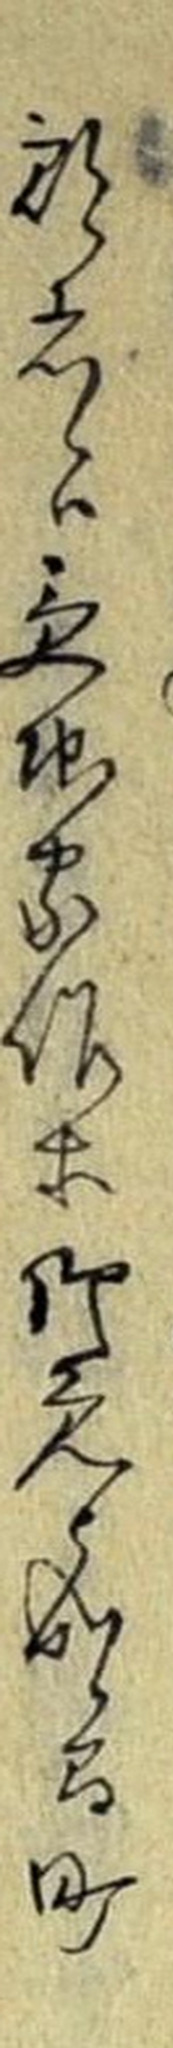願候者へは受地家作等御免被成候間町御目付
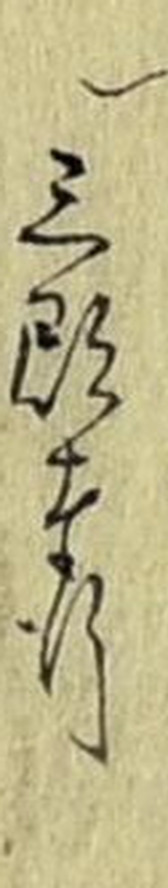下領郡奉行
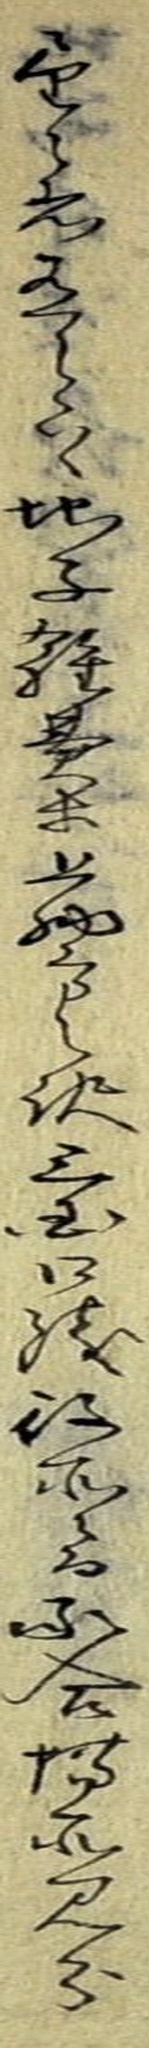望之者有之候はヽ地子雑費等上納方之訳三国口銭役所に而承合場所見分
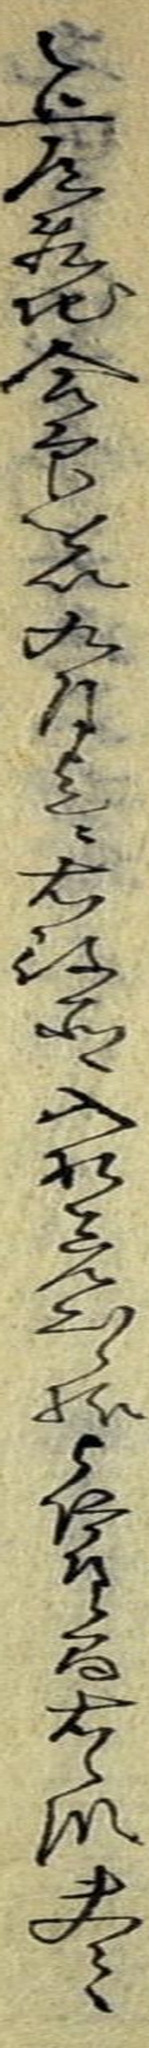之上屋敷地合印を以九月迄に右役所へ入札差出候様被仰付候間右之段夫々
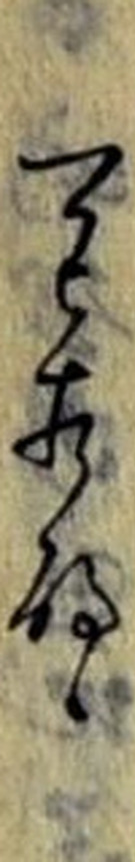可被相触候
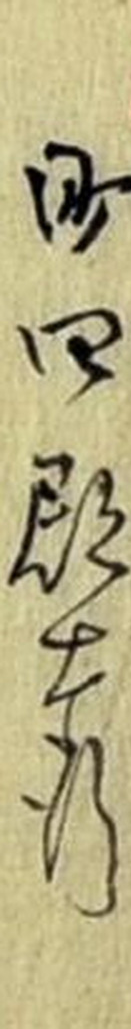前に町四郡奉行
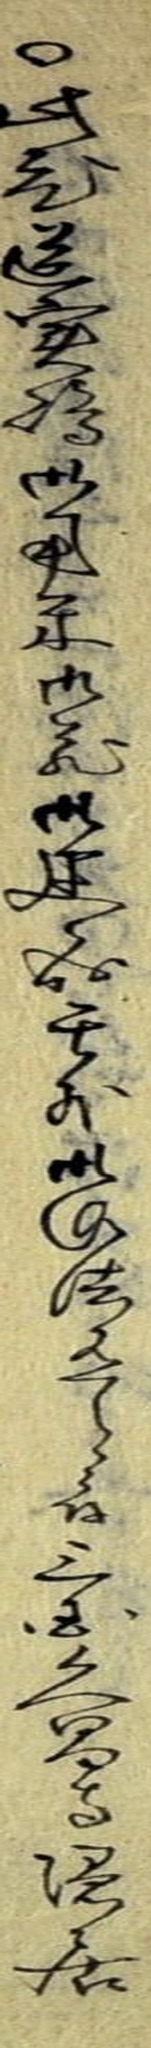○此度道実嶋御用米御蔵御建被成其外御趣法有之候に付三国久昌寺隠居
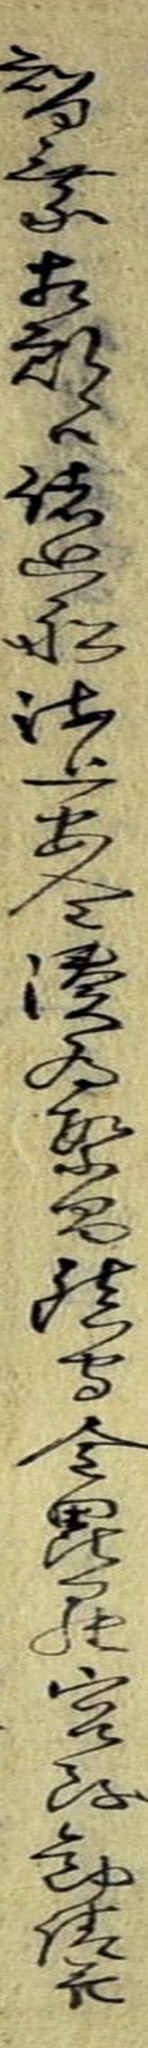智乗相願候は諸廻船海上安全湊為繁昌鎮守金比羅宮致勧請并
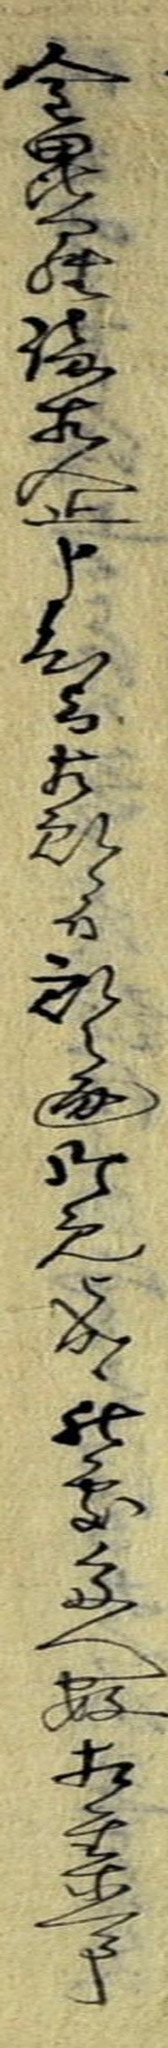金比羅講相企申度旨相願候に付願之通御免被成候然処多人数相集可申

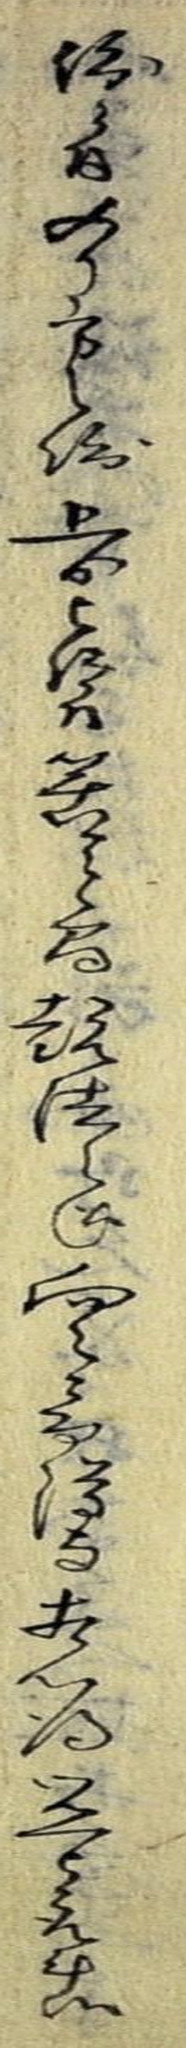儀に付〆り方之儀上ゟ被仰付筈に候間趣法之趣面々に而得と相心得置可被取計候
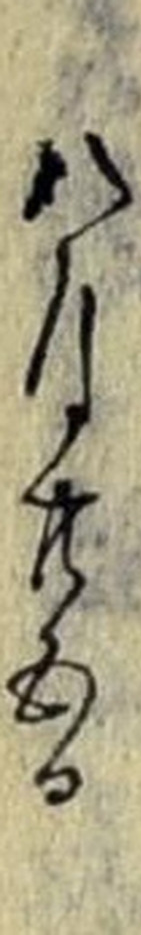八月廿五日
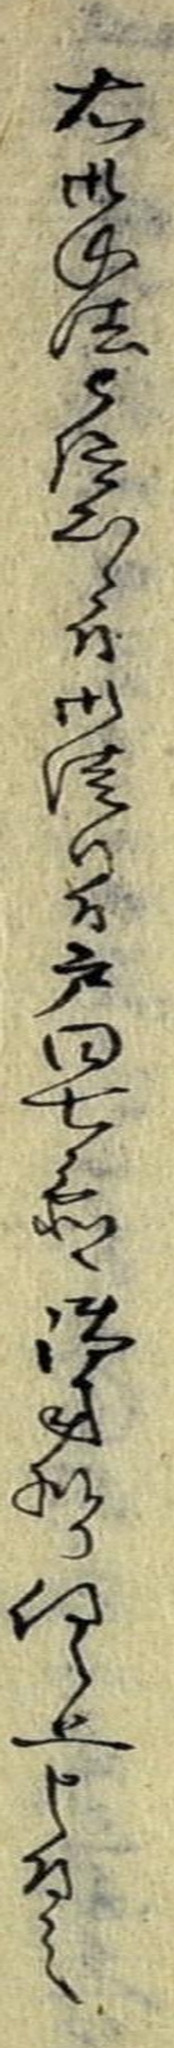右御趣法被仰出候に付御徒目付戸田七兵衛へ御用掛り伺之上申付之
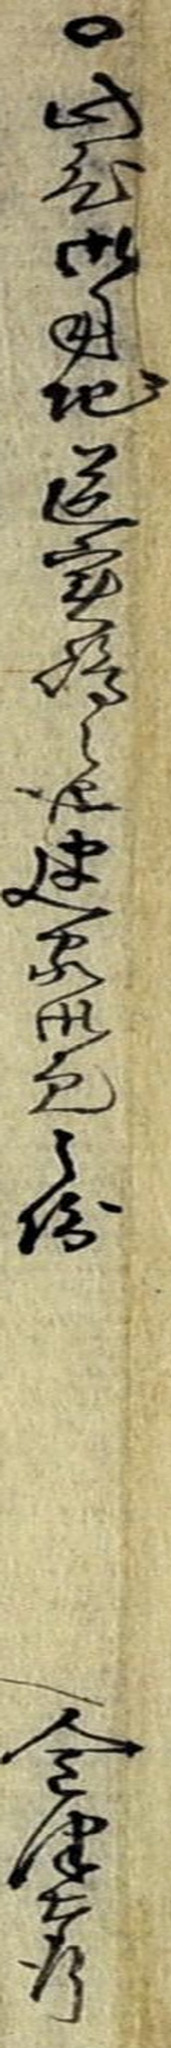○此度御用地道実嶋之儀建家御免之儀金津奉行
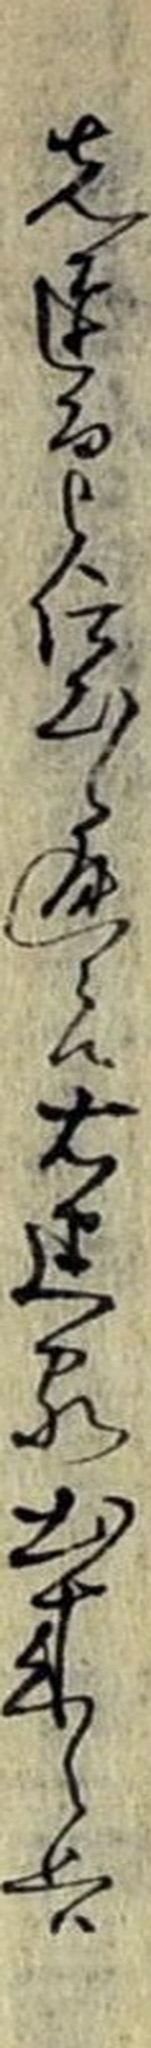先達而被仰出候通に候右建家出来候上は御奉行
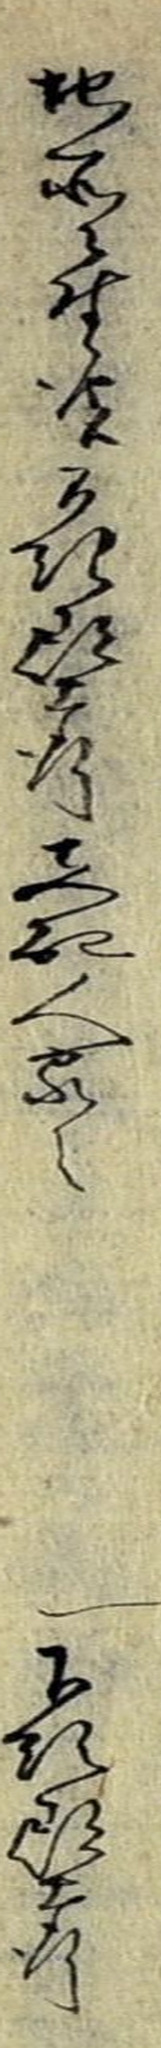地所に付候儀は下領郡奉行支配人家之下領郡奉行
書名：命令之部 四
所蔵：福井県文書館 Fukui Prefectural Archives
